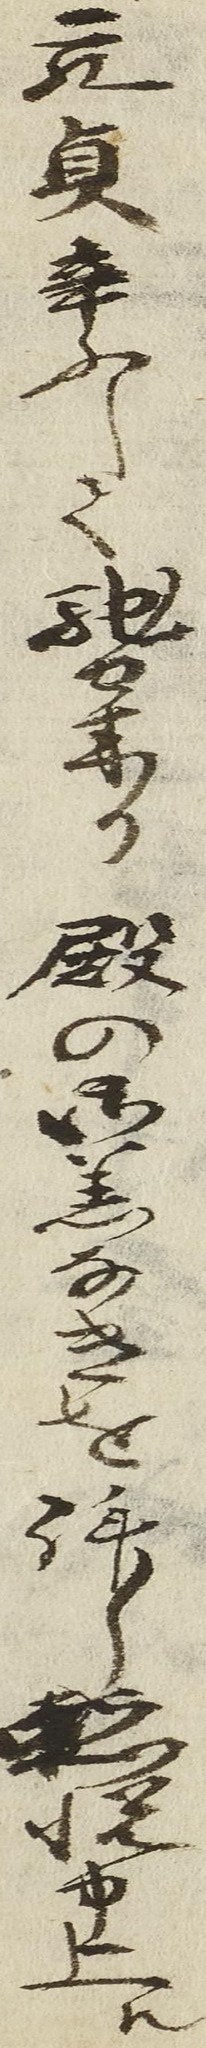元貞辛ふして馳せ来り殿の御恙なきを拝し恐悦申上ル
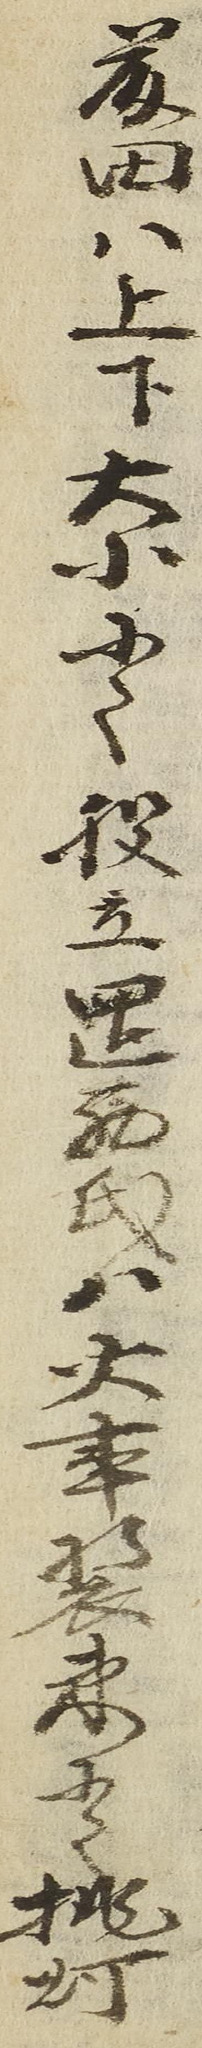藤田は上下大小にて股立岡西氏は火事装束にて挑灯

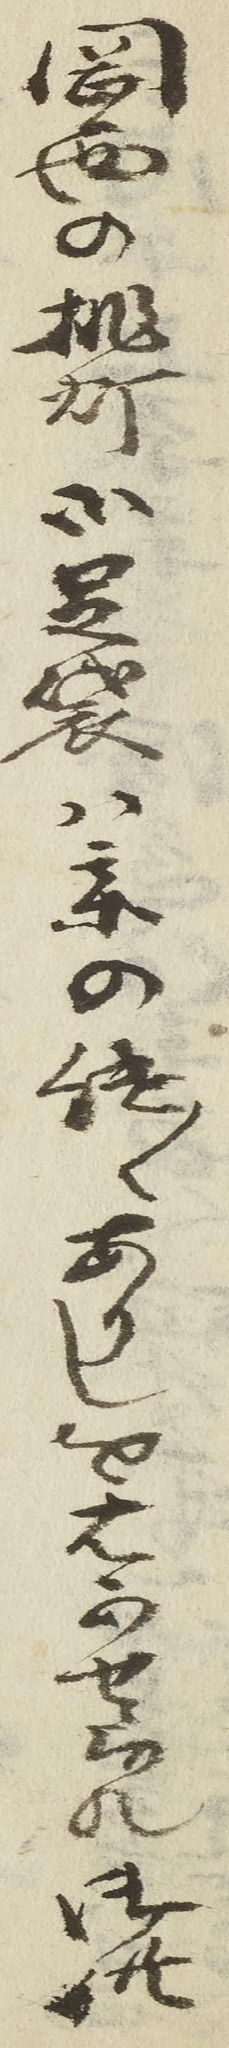岡西の挑灯御足袋は某の継々ありしをはかせられ御供
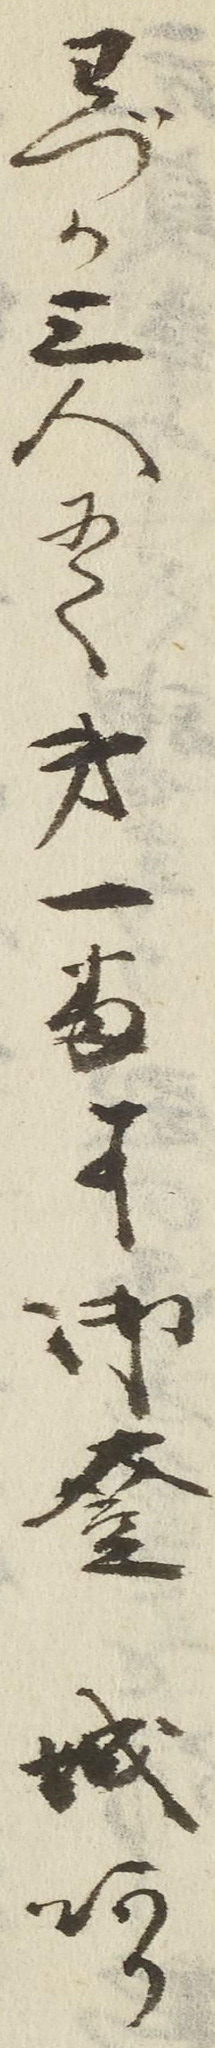わづか三人にて第一番に御登城あり
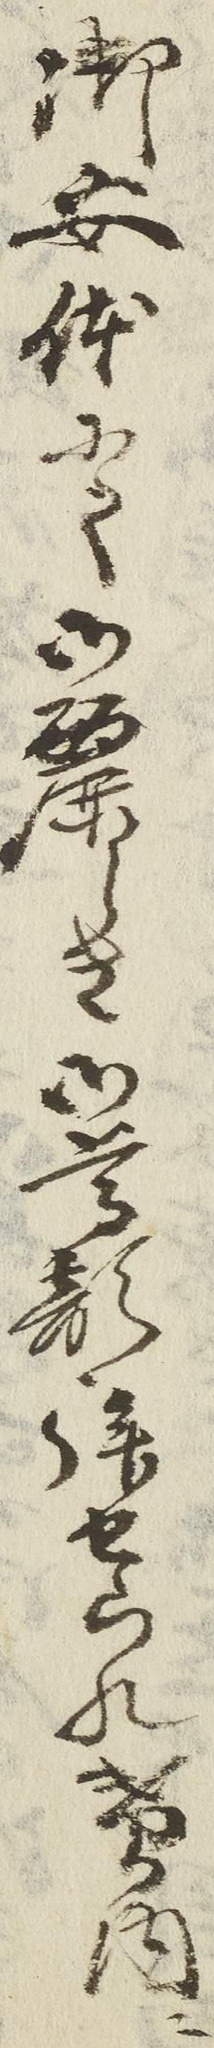御安体にて御麗しき御尊顔拝せられける内ニ
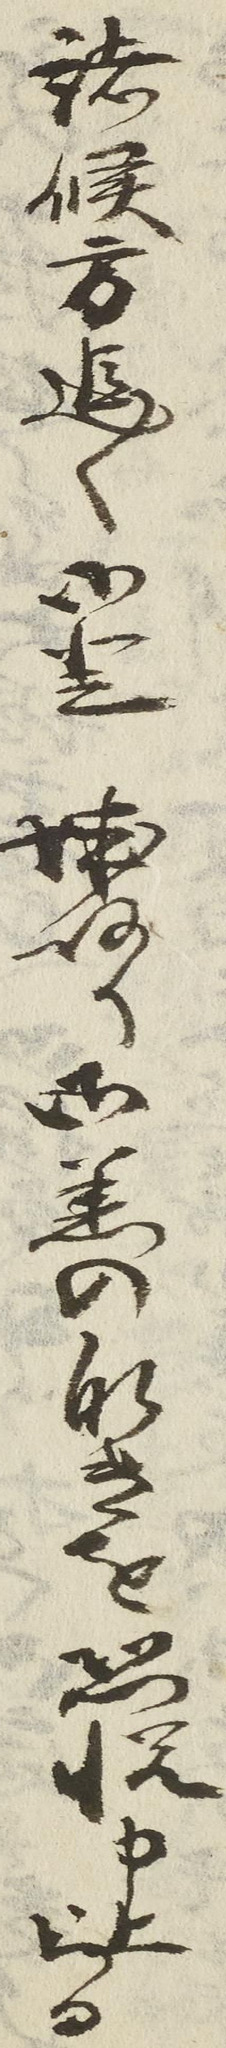諸侯方追々御登城あり御恙のなきを恐悦申上らる
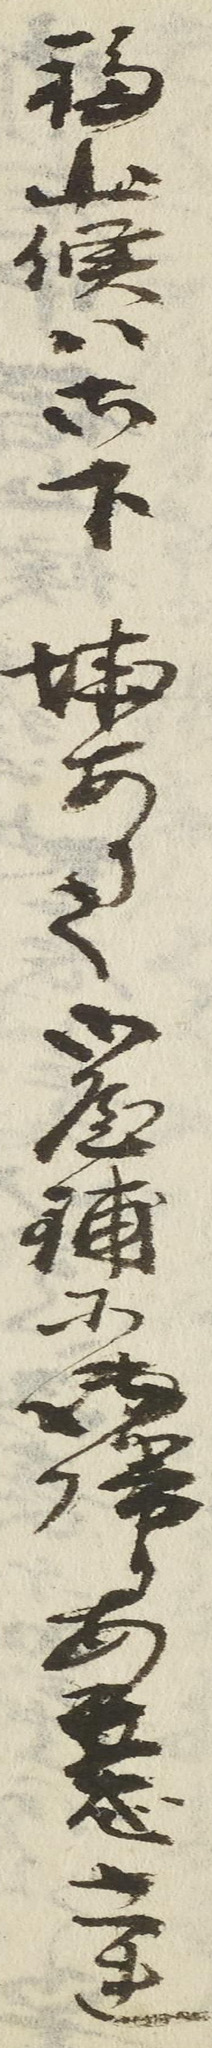福山侯は御下城ありて御屋鋪に御帰りあそばされ
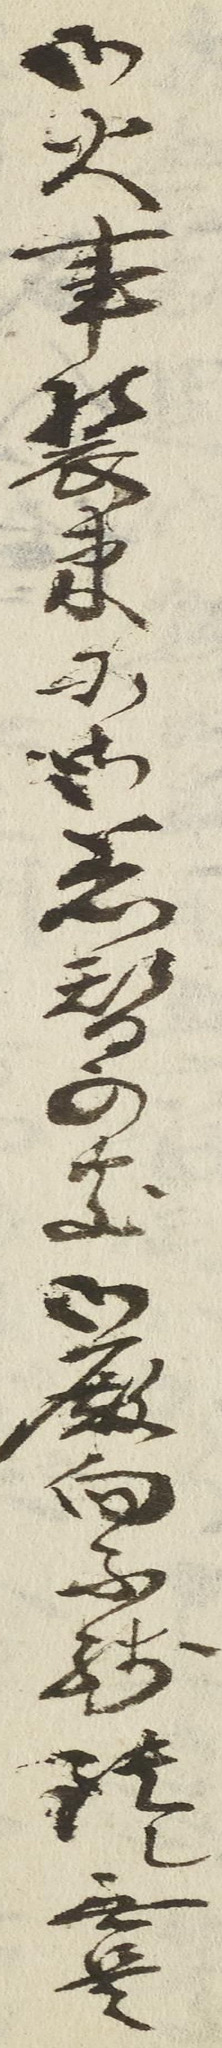御火事装束に御着替の処御殿向不残潰レ無是
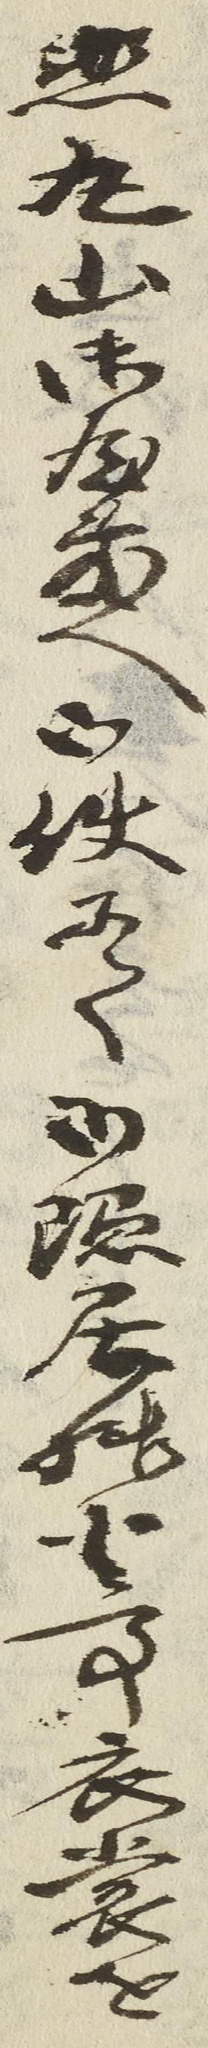悲丸山御屋敷へ御使にて御隠居様火事衣裳を
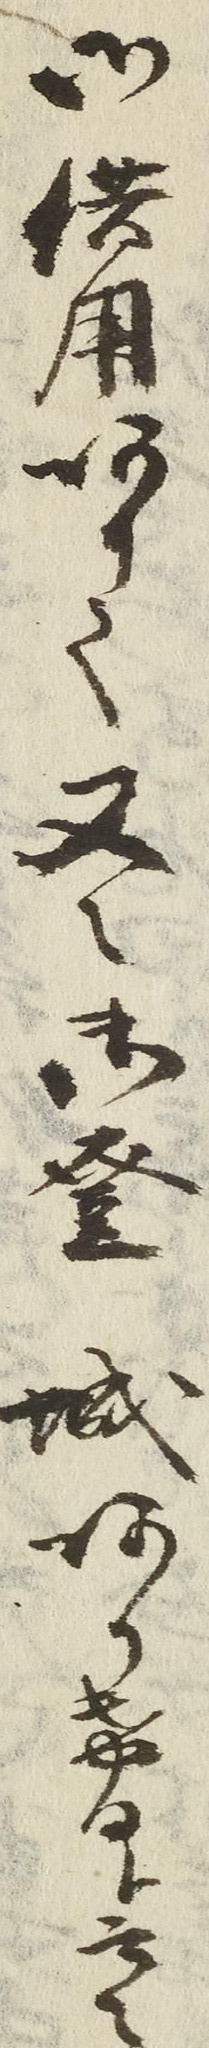御借用ありて又々御登城ありけるト云々
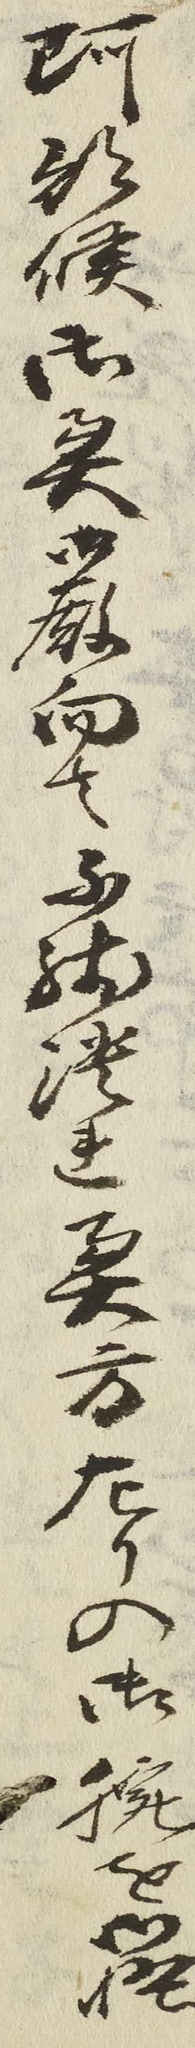阿部侯御奥御殿向は不残潰れ奥方左りの御腕を御怪
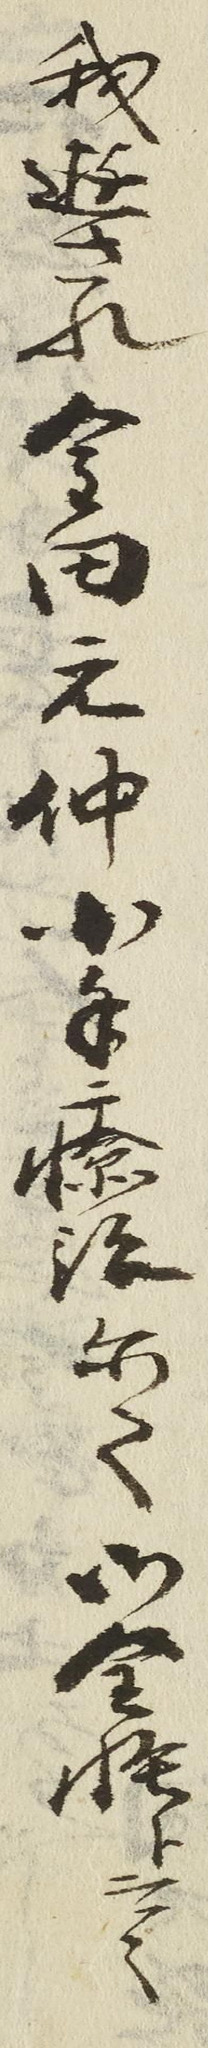我遊され金田元仲小手療法にて御全怪ト云々
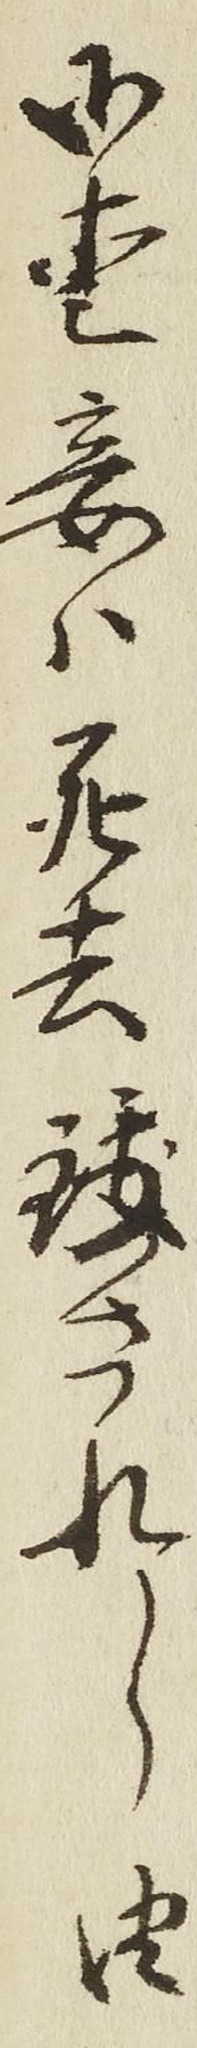御愛妾は死去致されし由
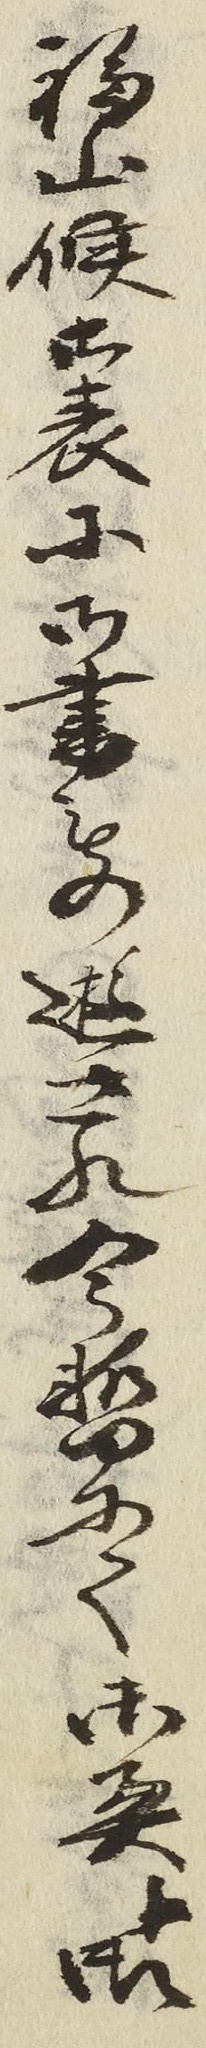福山侯御表に御書もの遊され今暫にて御奥江御
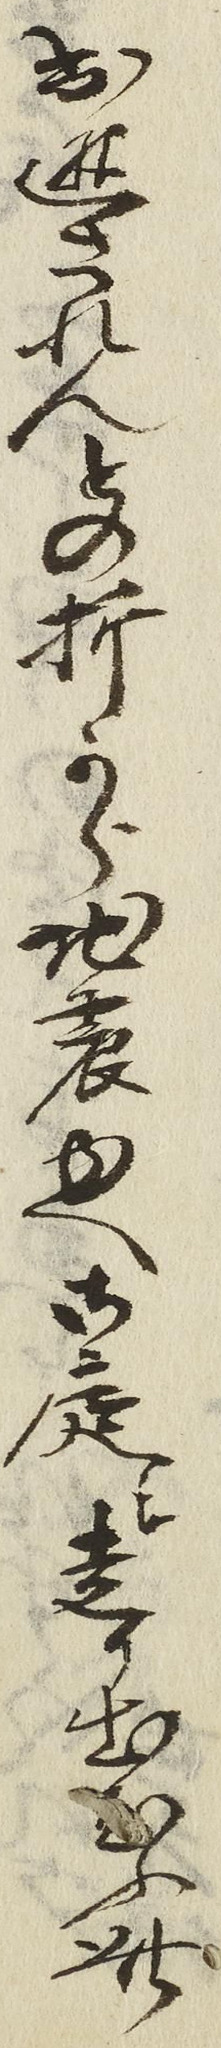出遊されんとの折から地震ゆへ御庭江走り出玉ふ此
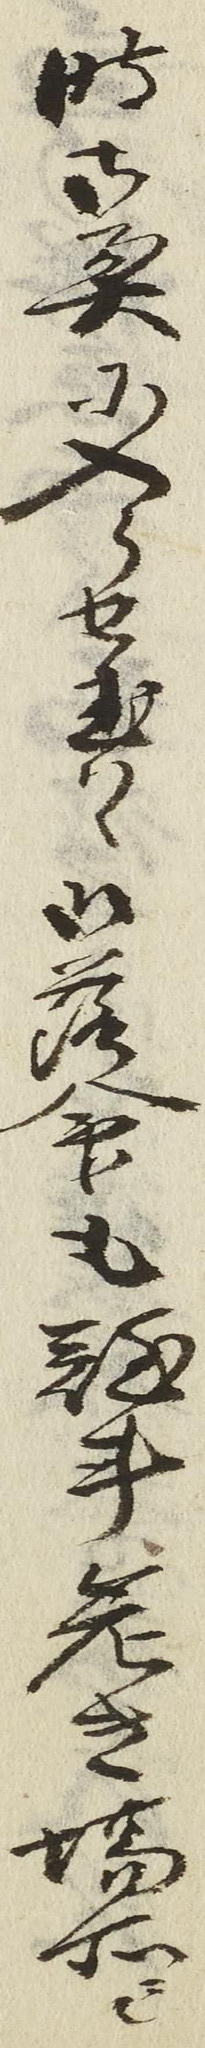時御奥に入らせ玉ハヽ御落命も難計危き場所ニ候
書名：安政二年震災記事　完
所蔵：東京大学地震研究所図書室 Earthquake Research Institute Library, The University of Tokyo, JAPAN
